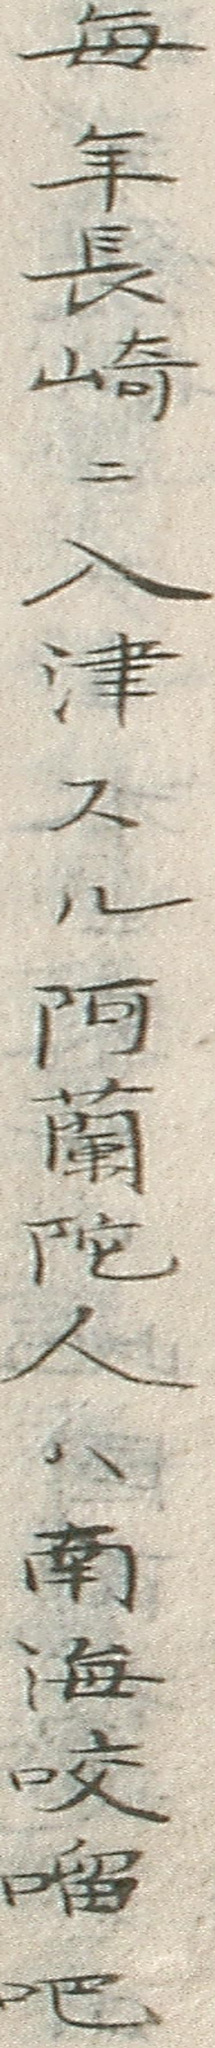毎年長崎ニ入津スル阿蘭陀人ハ南海咬𠺕吧

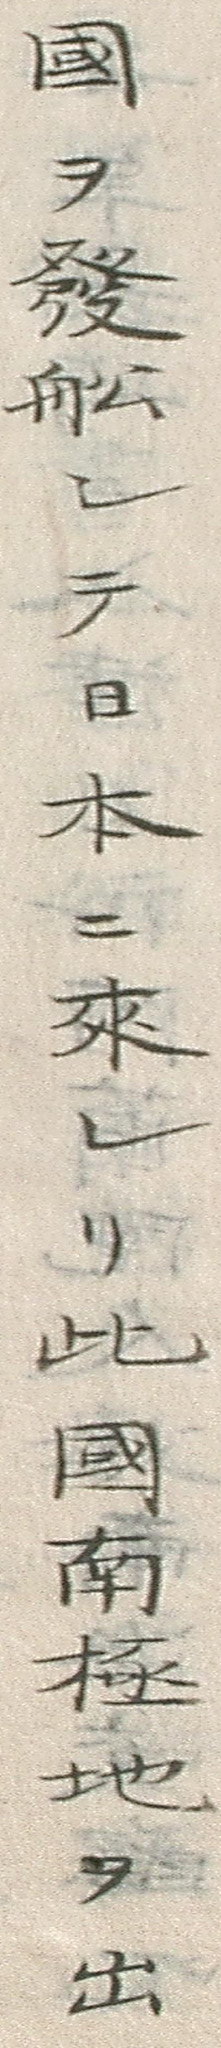国ヲ発舩シテ日本ニ来レリ此国南極地ヲ出
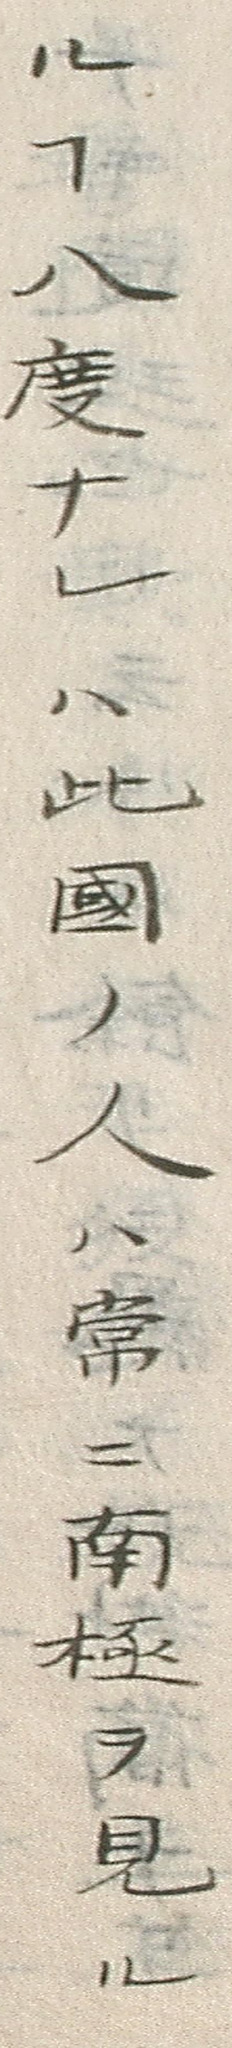ルコト八度ナレハ此国ノ人ハ常ニ南極ヲ見ル
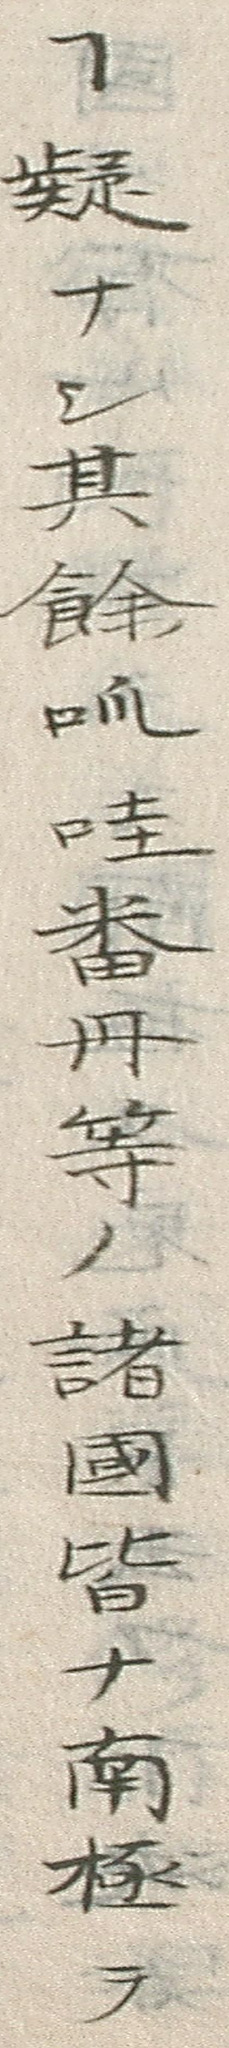コト疑ナシ其余？哇番丹等ノ諸国皆ナ南極ヲ
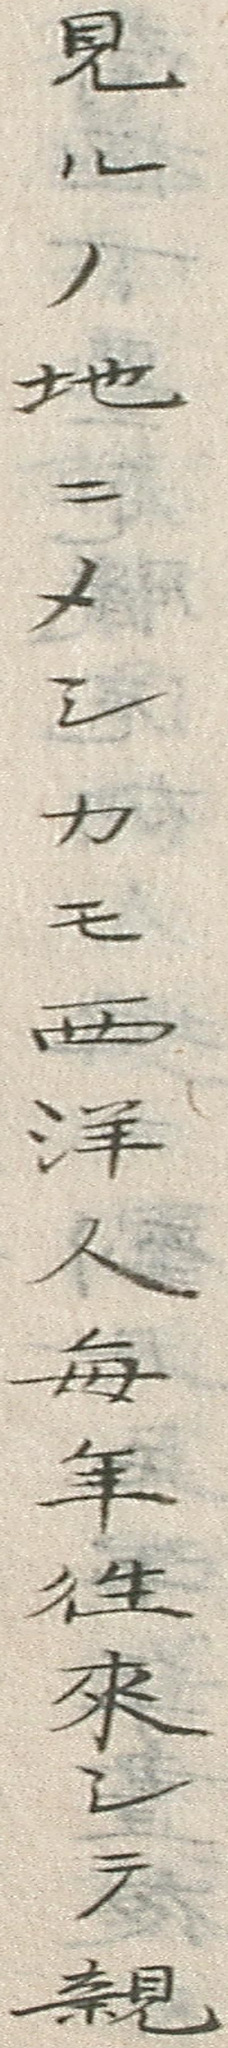見ルノ地ニシテシカモ西洋人毎年往来シテ親
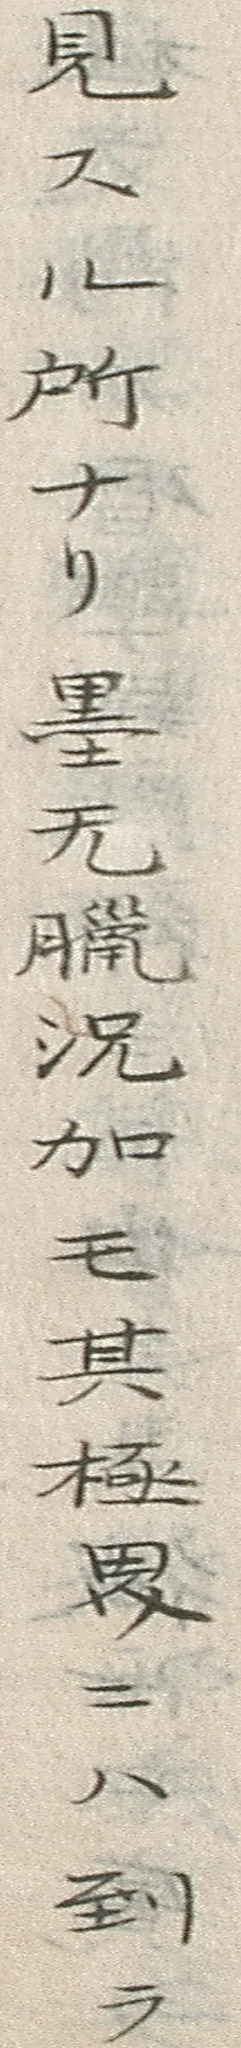見スル所ナリ墨无臘況加モ其極界ニハ到ラ
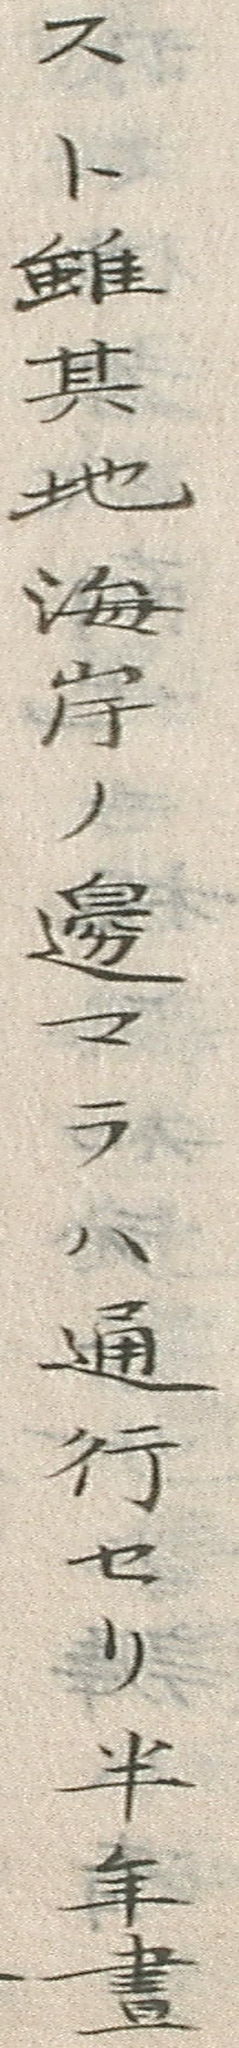スト雖其地海岸ノ辺マテハ通行セリ半年昼
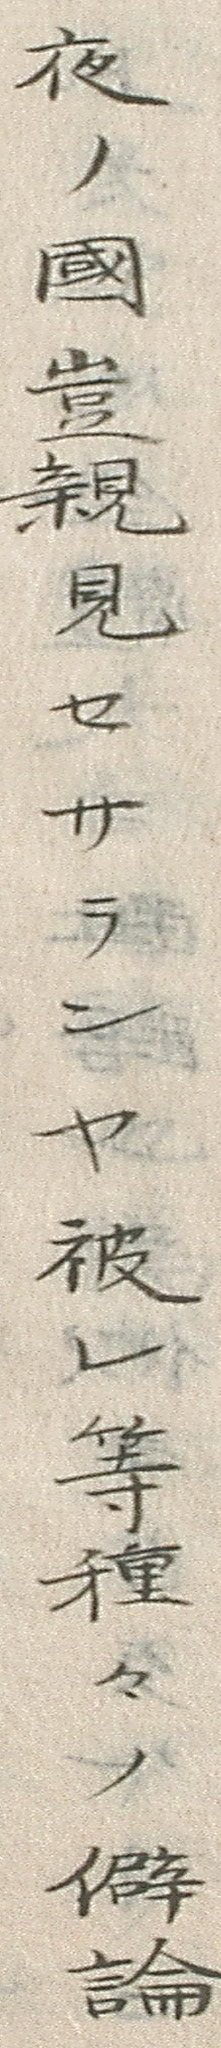夜ノ国豈親見セサランヤ彼レ等種々ノ僻論
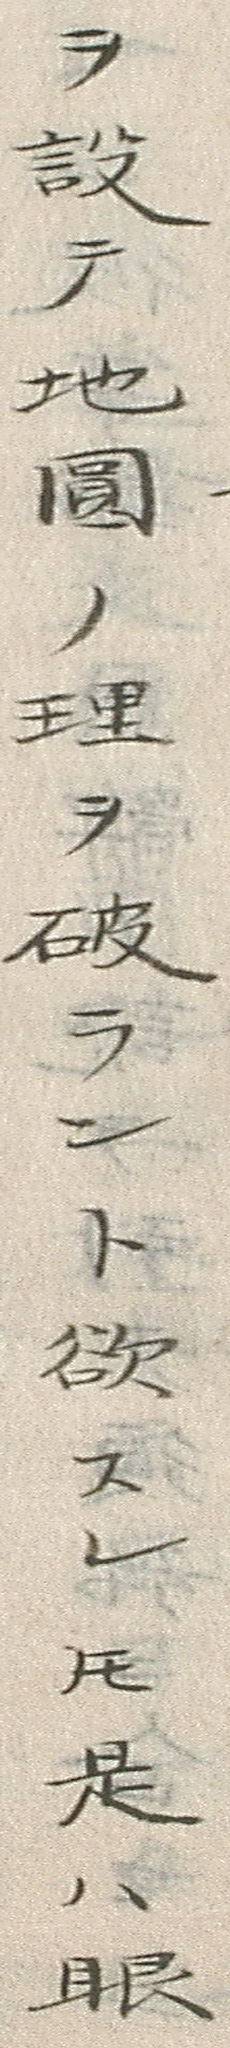ヲ設テ地円ノ理ヲ破ラント欲スレトモ是ハ眼
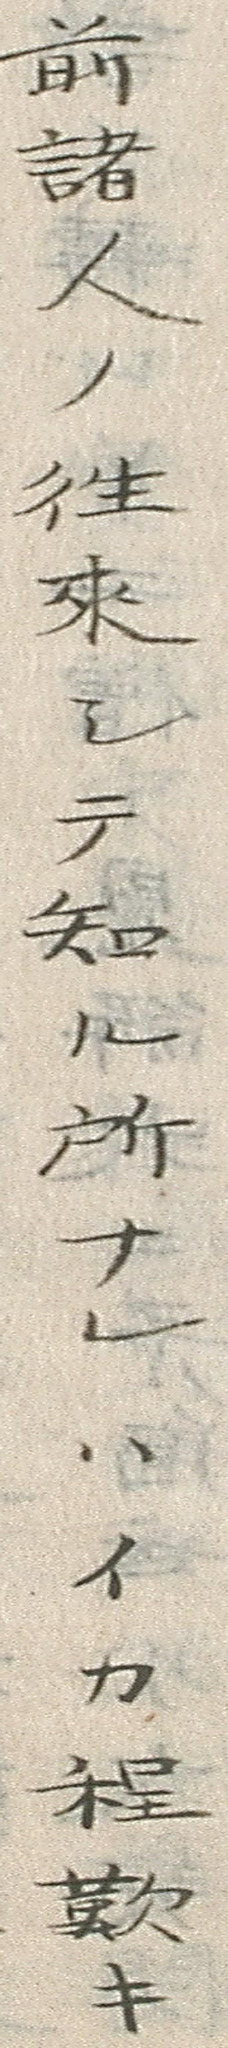前諸人ノ往来シテ知ル所ナレハイカ程歎キ
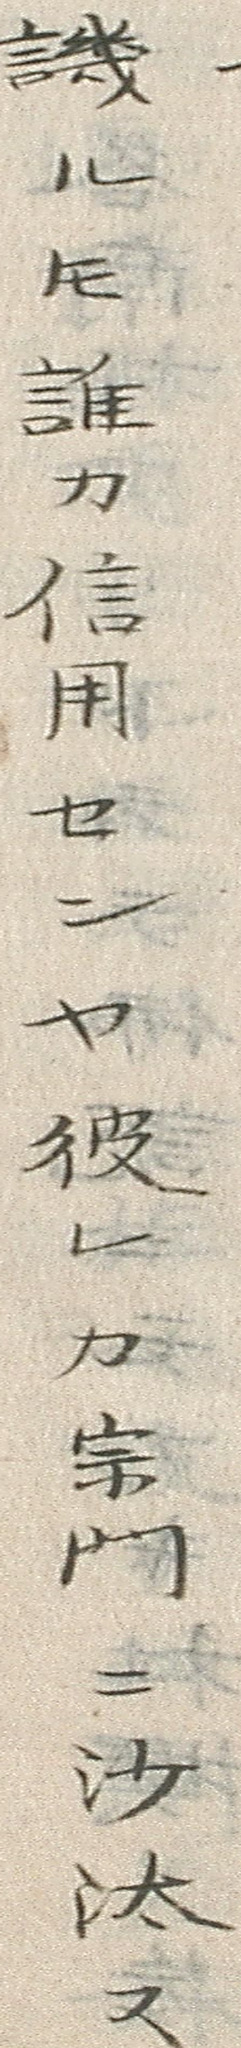譏ルトモ誰カ信用センヤ彼レカ宗門ニ沙汰ス
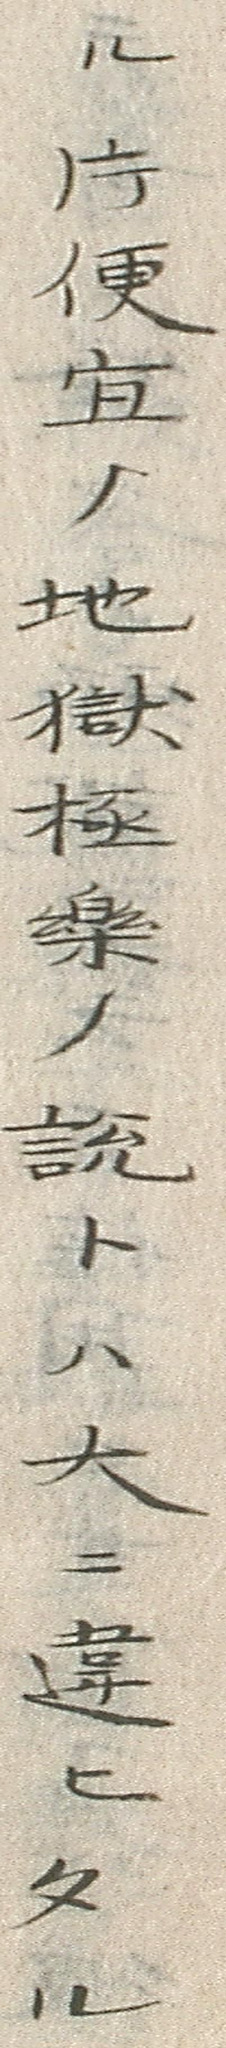ル片便宜ノ地獄極楽ノ説トハ大ニ違ヒタル
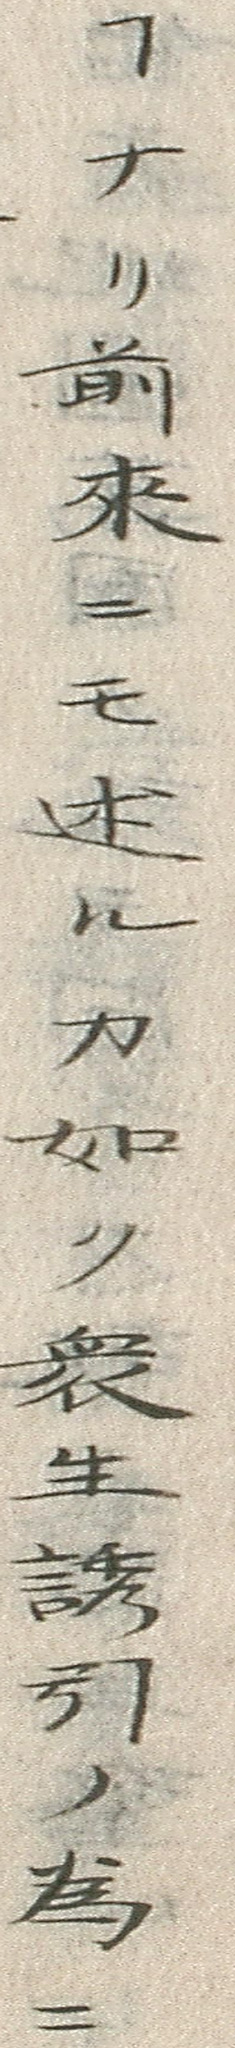コトナリ前来ニモ述ルカ如ク衆生誘引ノ為ニ
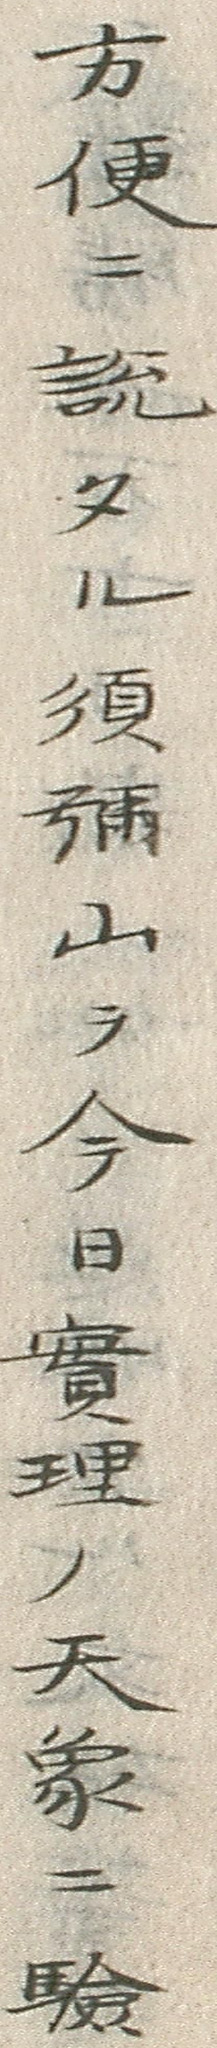方便ニ説タル須弥山ヲ今日実理ノ天象ニ験
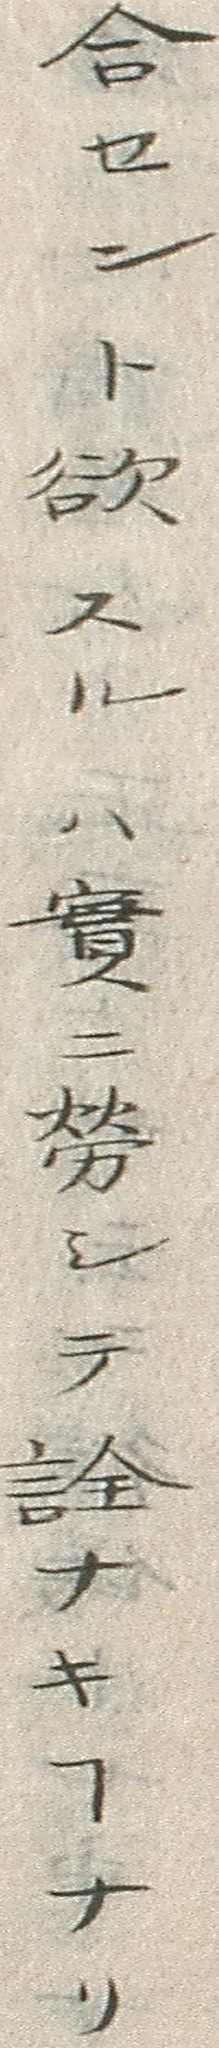合セント欲スルハ実ニ労シテ詮ナキコトナリ
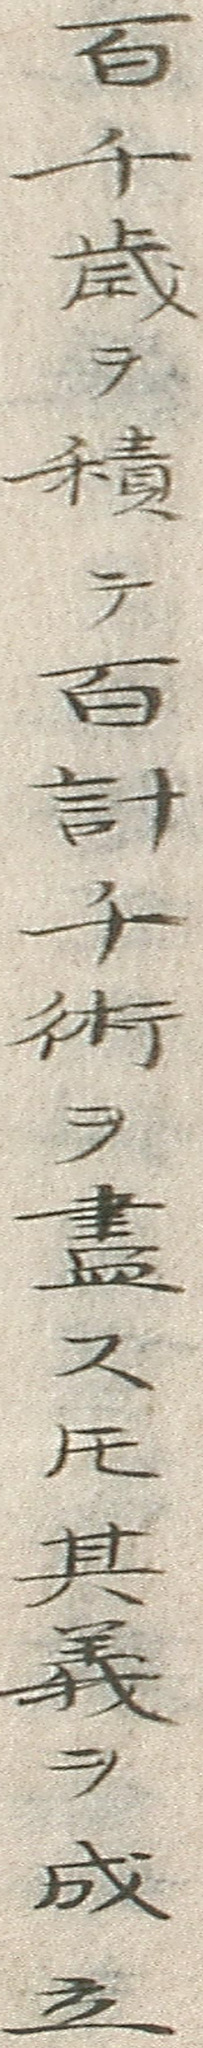百千歳ヲ積テ百計千術ヲ尽ストモ其義ヲ成立
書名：天學略名目羽翼　全
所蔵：東京大学地震研究所図書室 Earthquake Research Institute Library, The University of Tokyo, JAPAN
